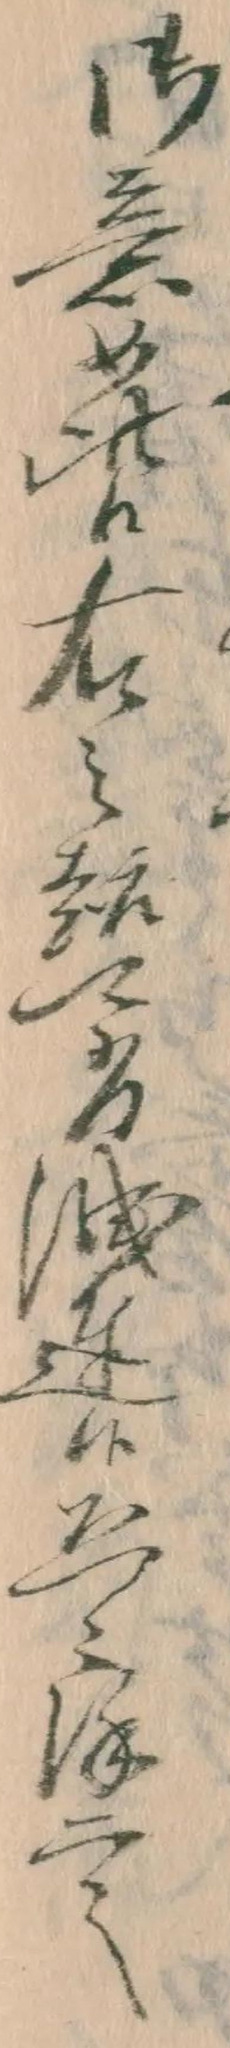御意如此候右之趣可有減達候恐〻謹言
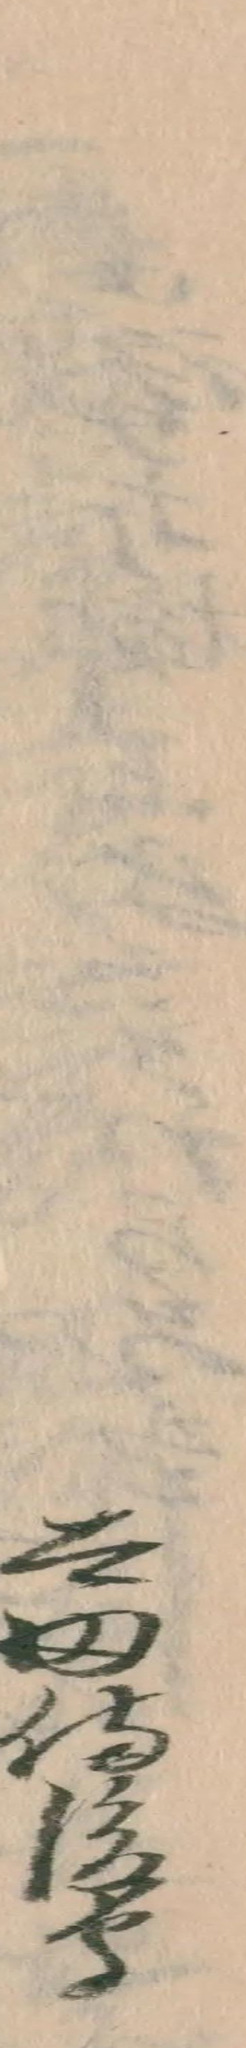太田備後守
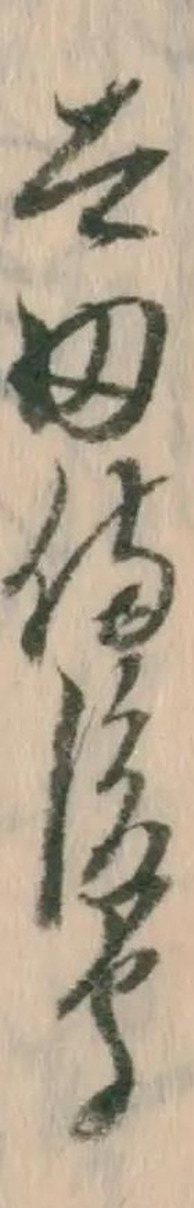太田備後守
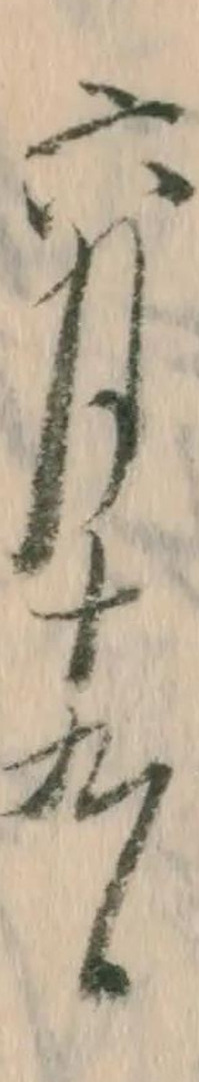六月十九日
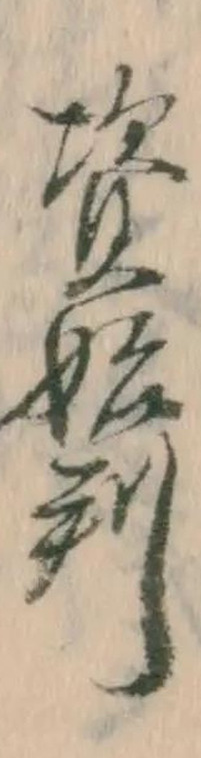資始判
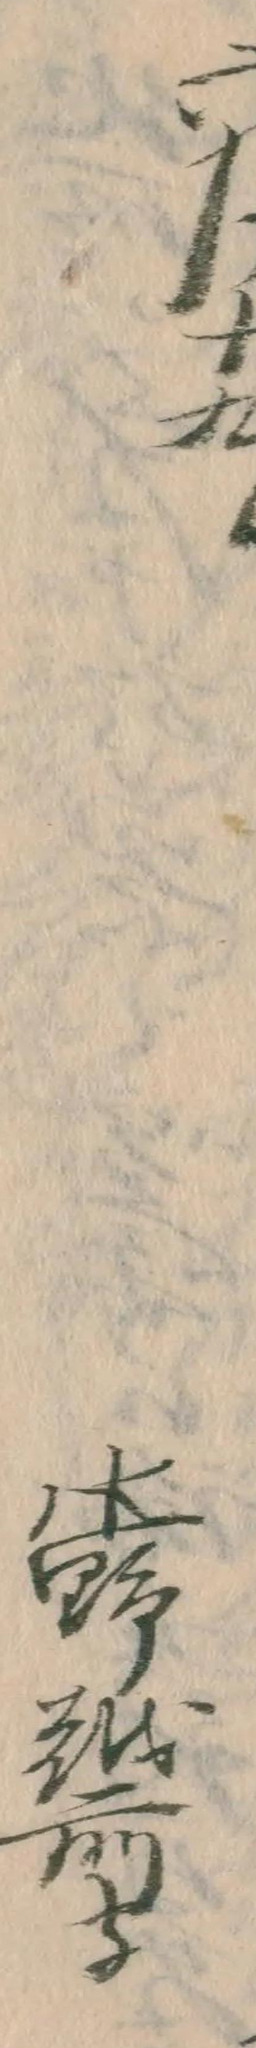水野越前守
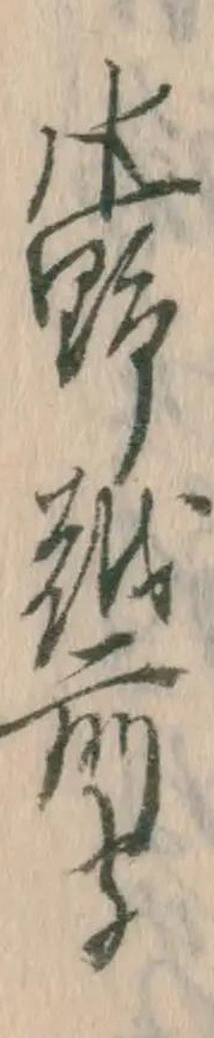水野越前守
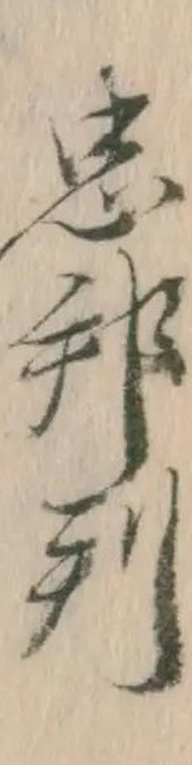忠邦判
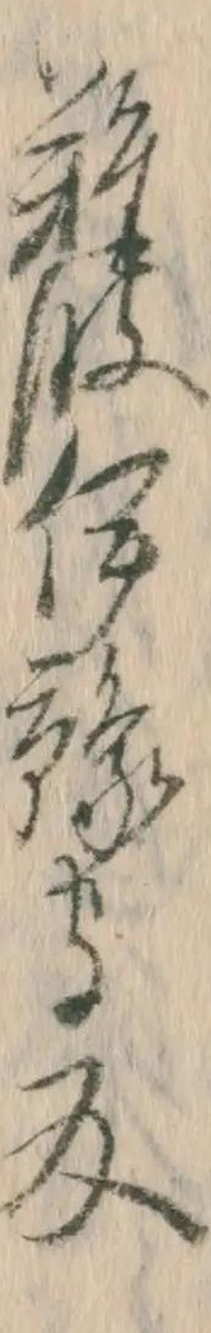難波伊豫守殿
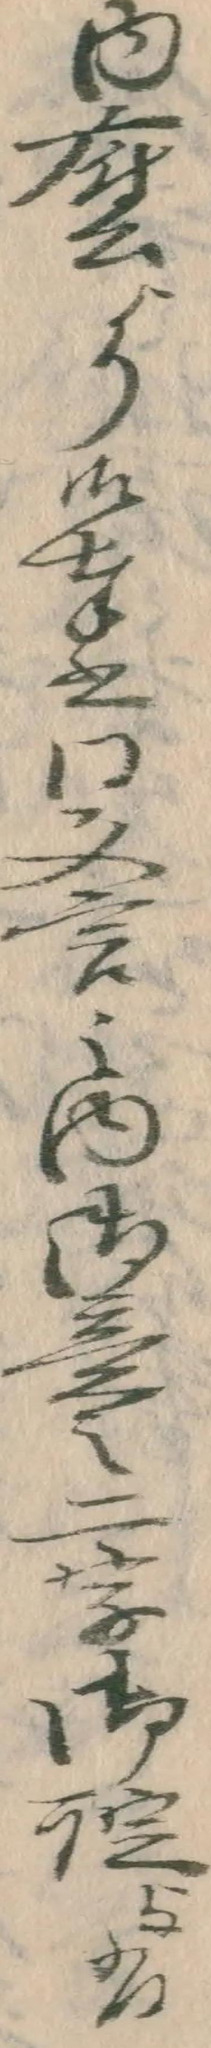内府公より御奉書同文言之内御意之二字御諚と有
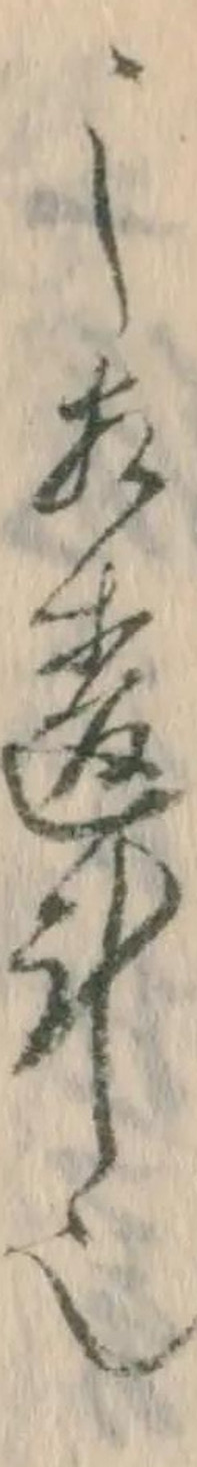之相違斗也
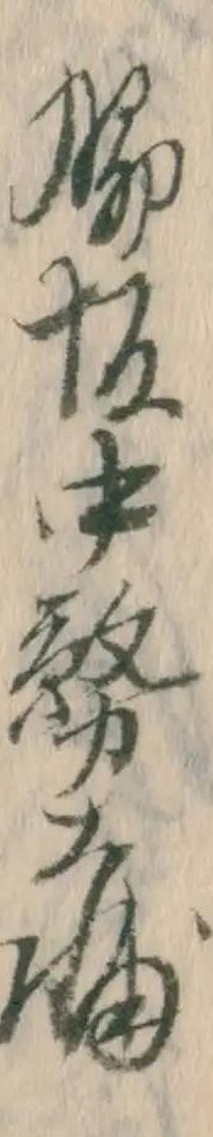脇坂中務大輔
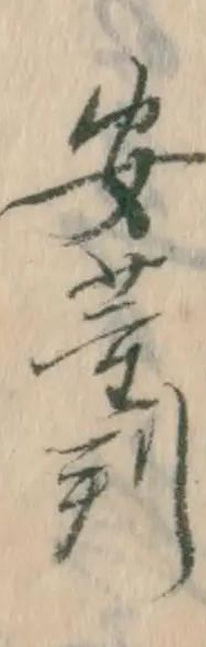安芸判
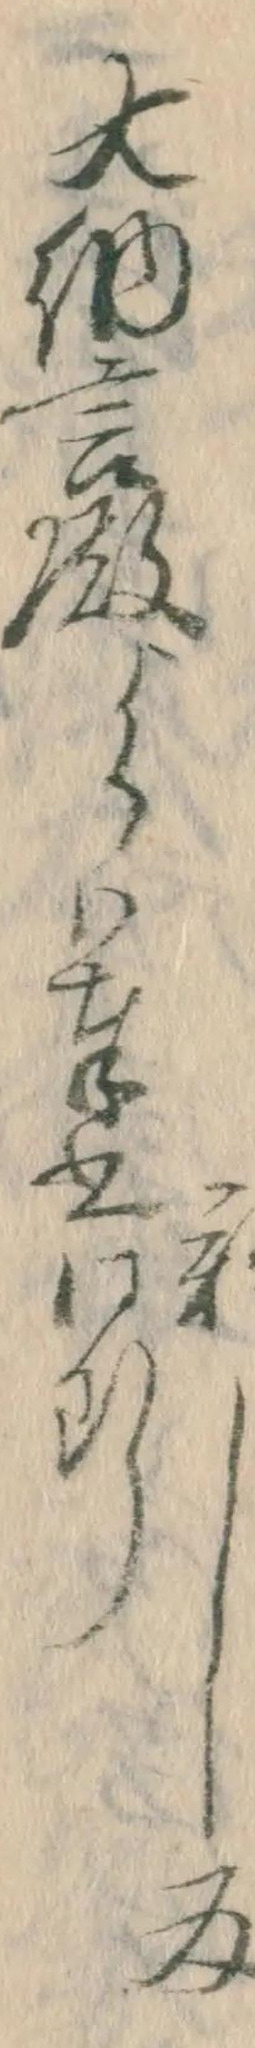大納言殿より御奉書同断
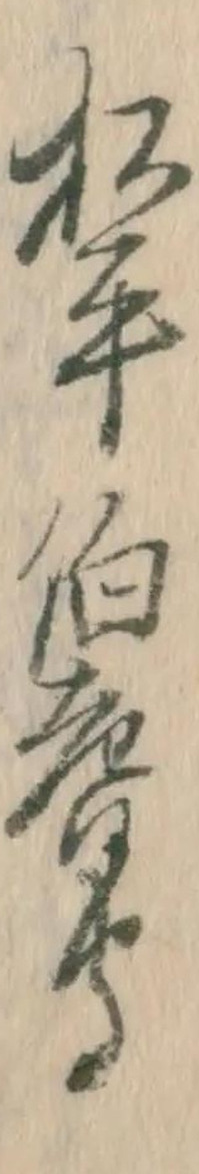松平伯耆守

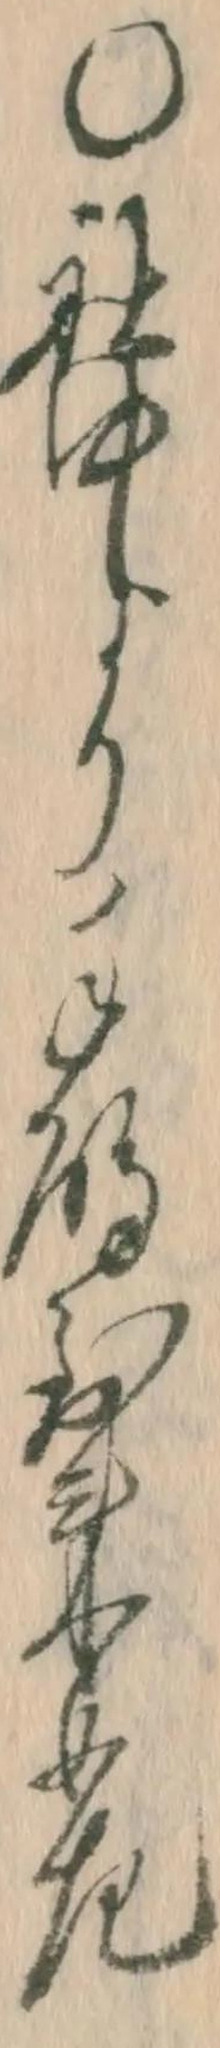○社中より手觸到来如左
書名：賀茂社記録. 第67冊
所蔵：国立国会図書館 National Diet Library, JAPAN
